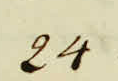24
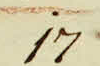17
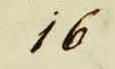16
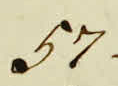57
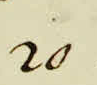20
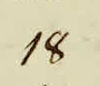18
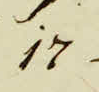17
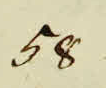58
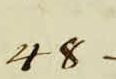48
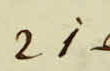21
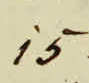15
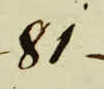81
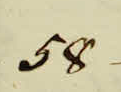58
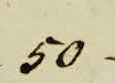50
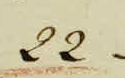22
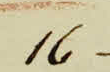16
